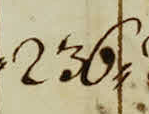236
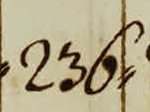236
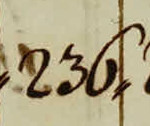236
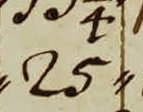25
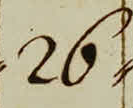26
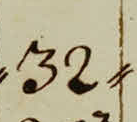32
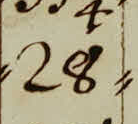28
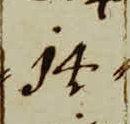14
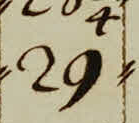29
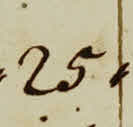25
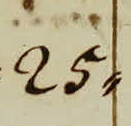25
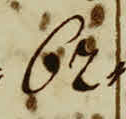62
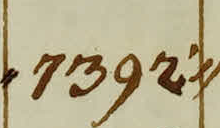7392
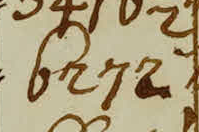6272
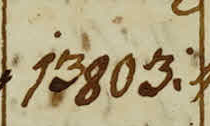13803
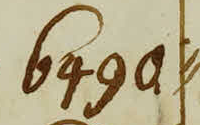6490
